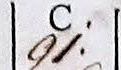91.
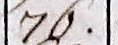76.
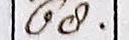68.
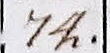74
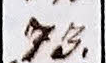73.
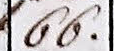66
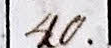40
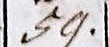59
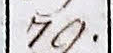79.
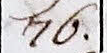76.
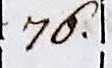76.
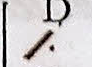1.
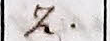2.
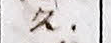2.
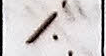1.
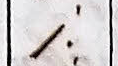1.
